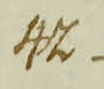42
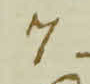7
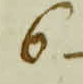6
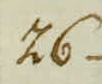26
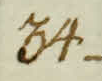34
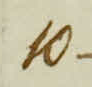10
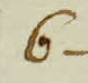6
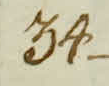34
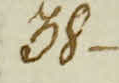38
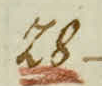28
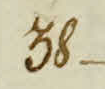38
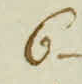6
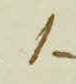1
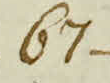67
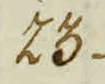23
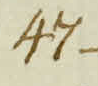47
